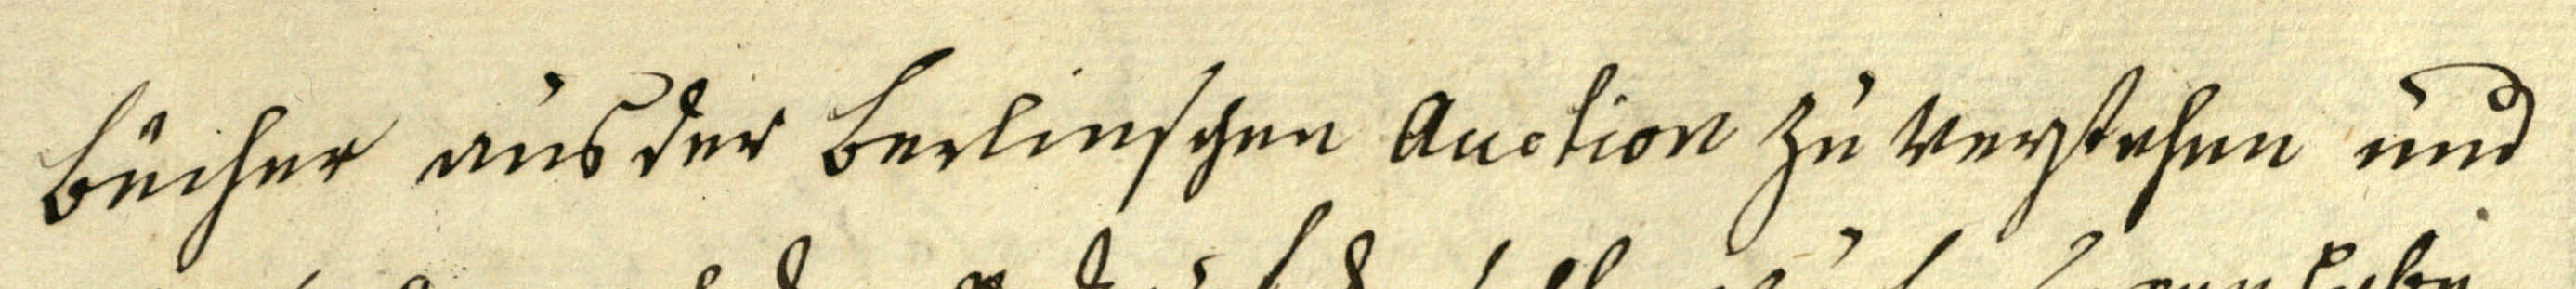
Bücher aus der Berlinschen Auction zu verstehen und
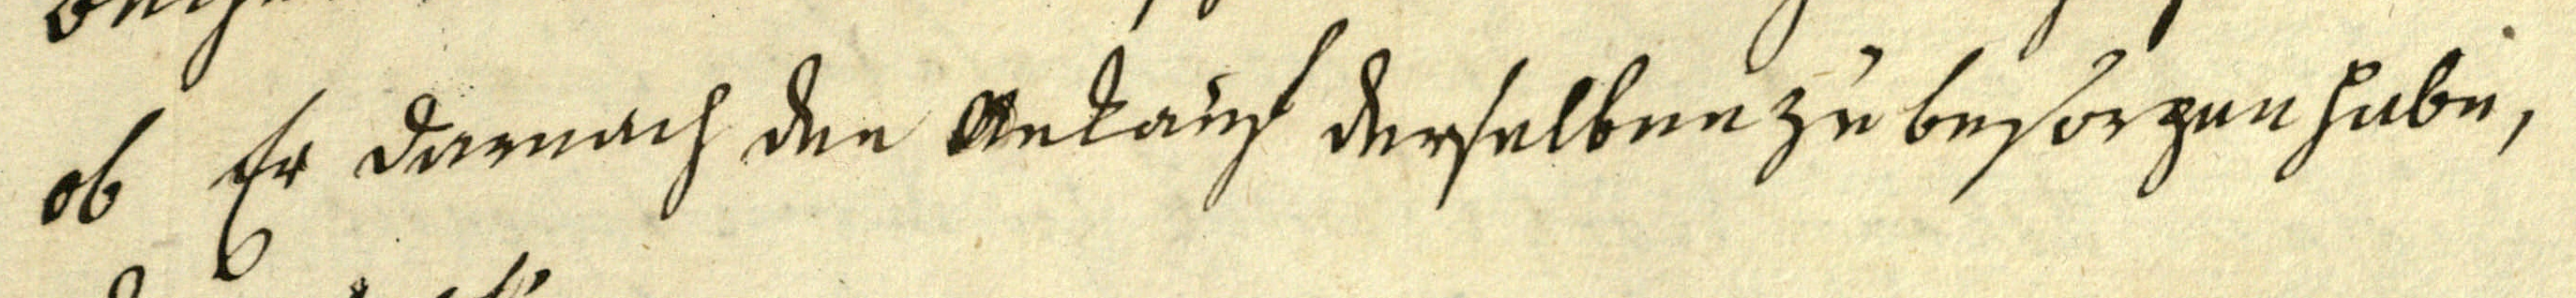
ob Er darnach den Ankauf derselben zu besorgen habe,
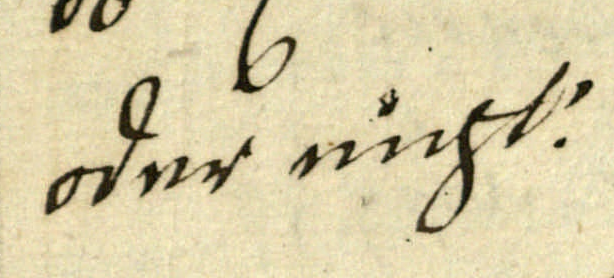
oder nicht?
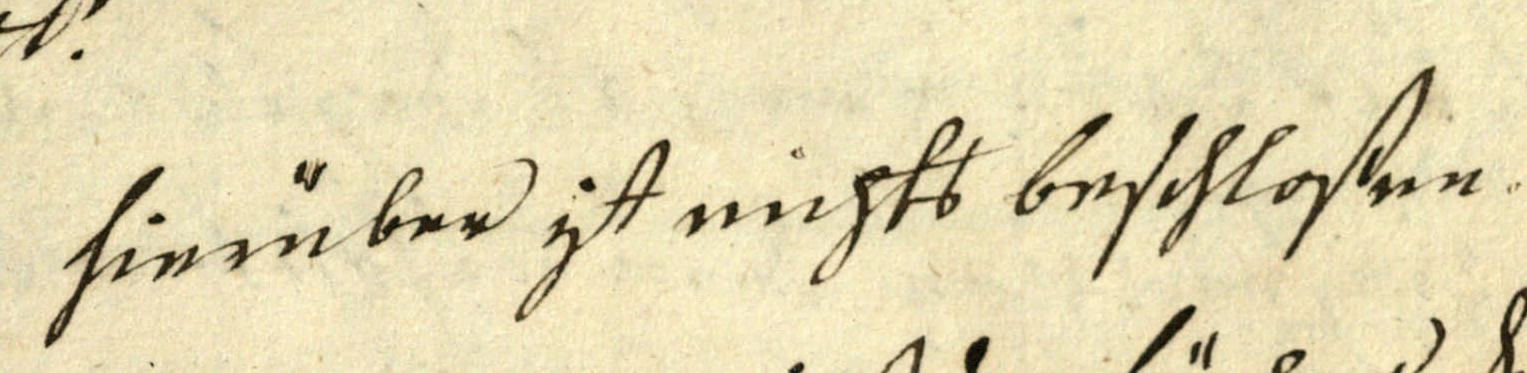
hierüber ist nichts beschloßen.
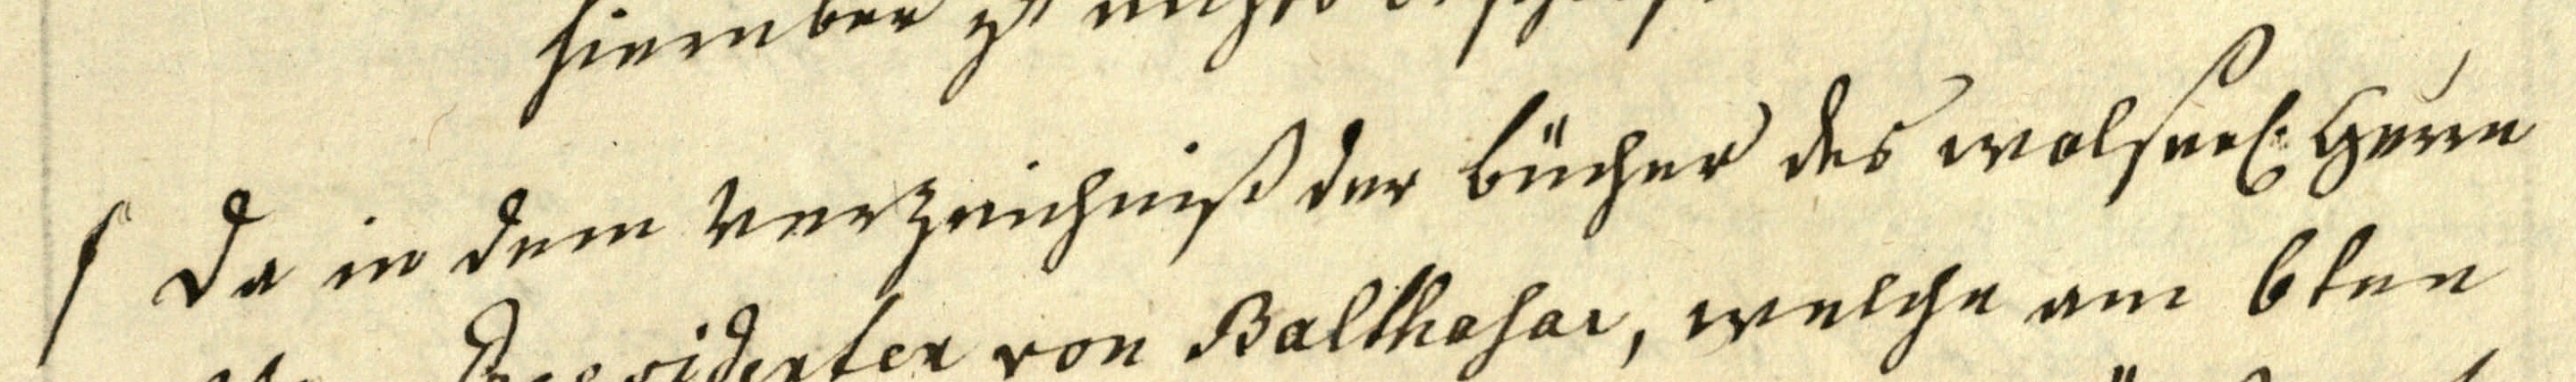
f da in dem Verzeichniß der Bücher des wolseel. Herrn
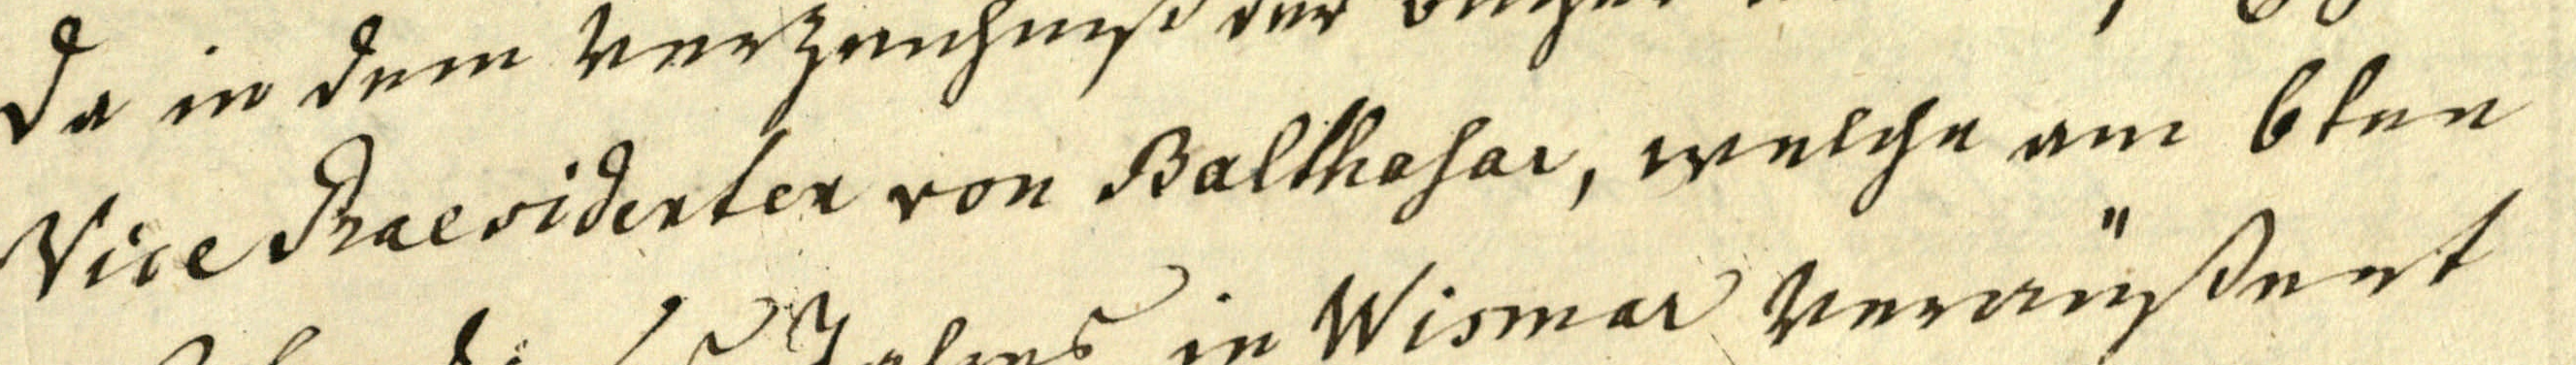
Vice Praesidenten von Balthasar, welche am 6ten
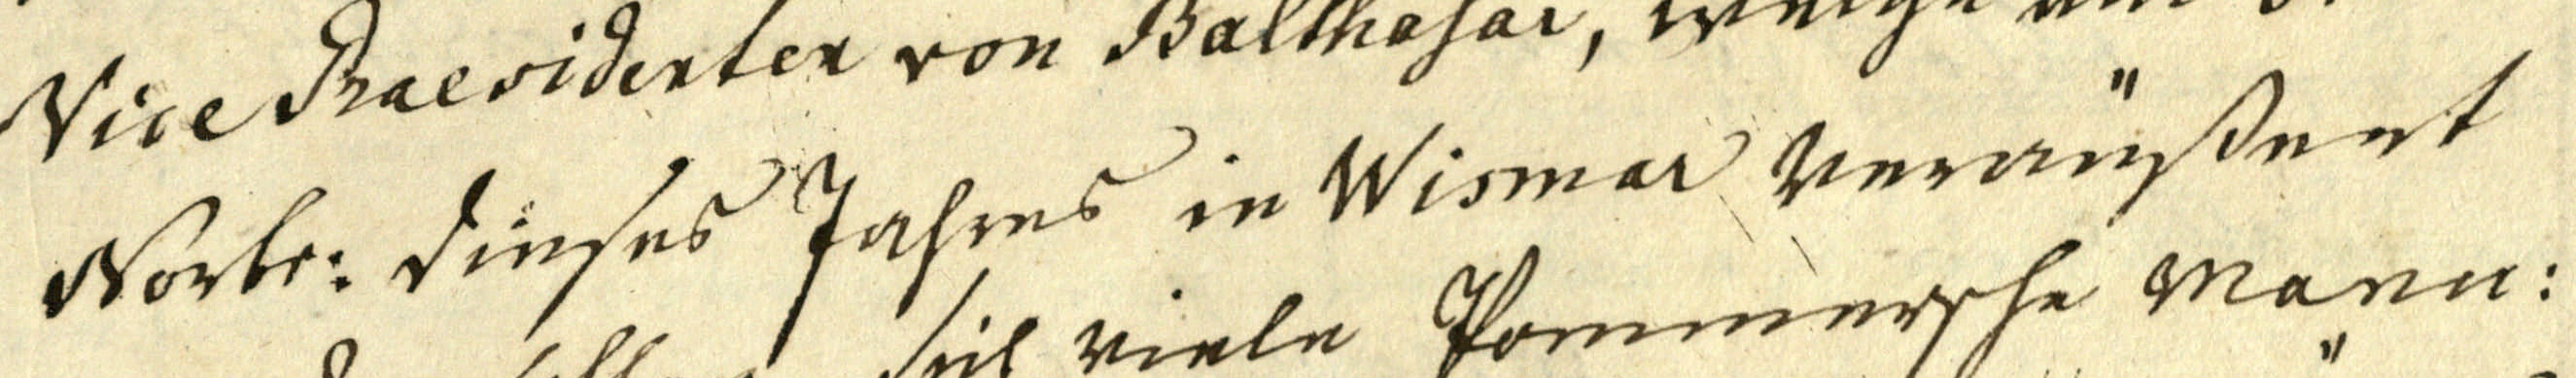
Novbr. dieses Jahres in Wismar veräußert
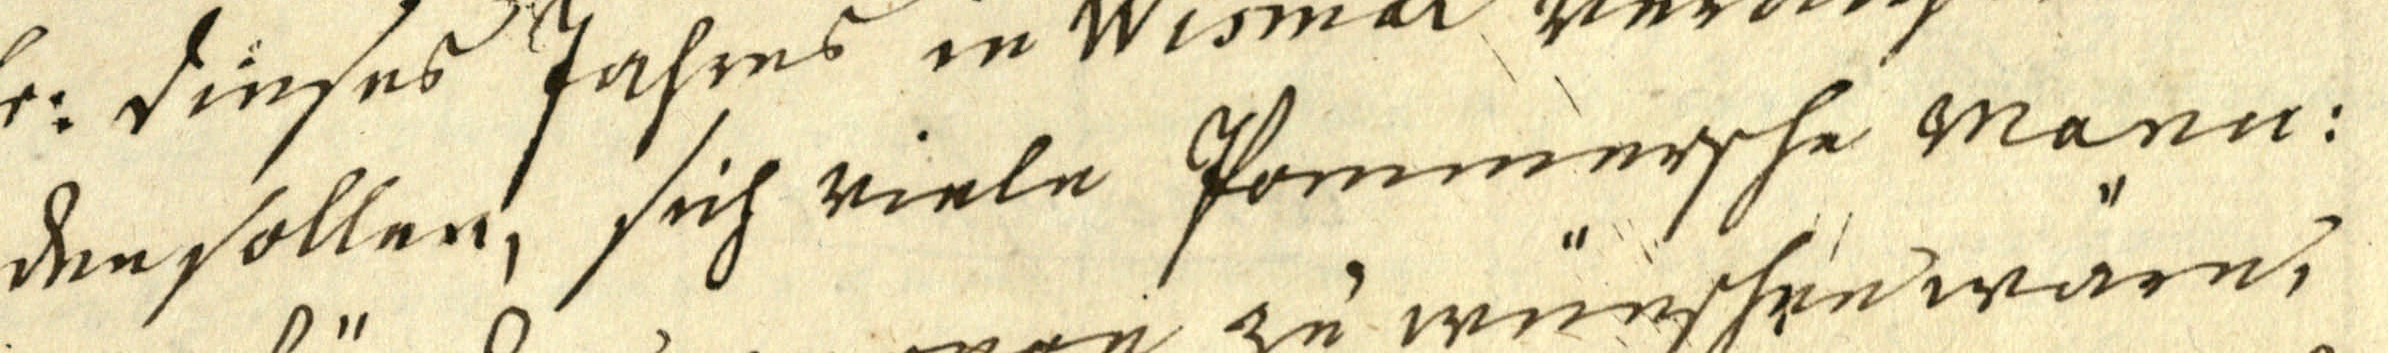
den sollen, sich viele Pommersche Manu¬
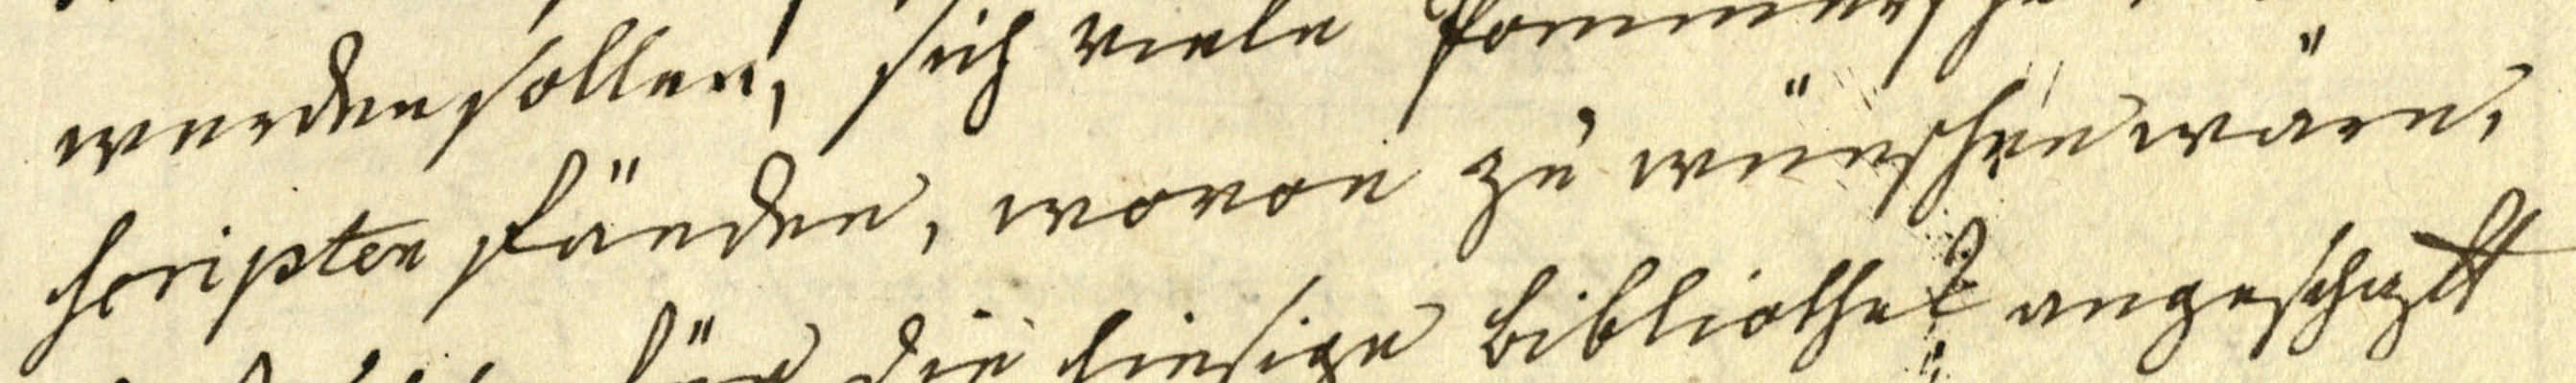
scripten fänden, wovon zu wünschen wäre,
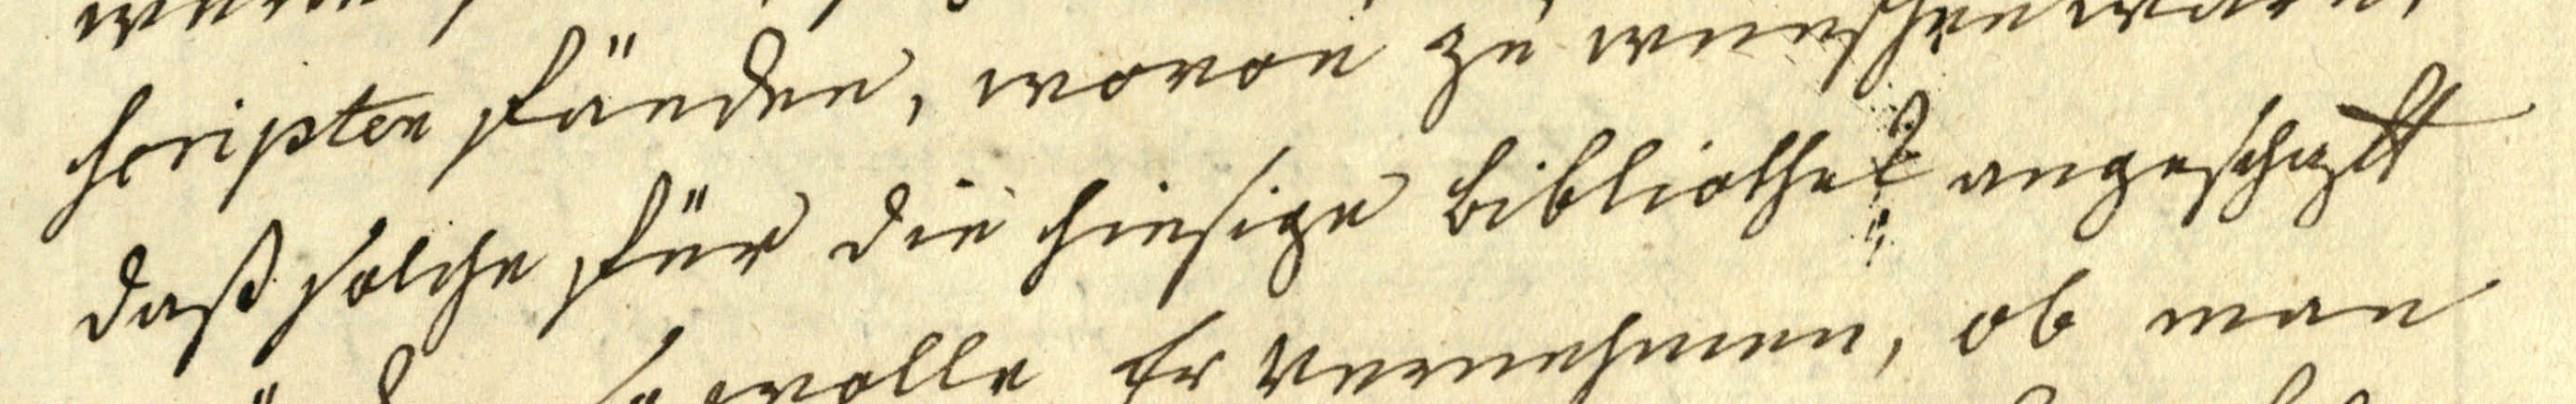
daß solche für die hiesigen Bibliothek angeschaft
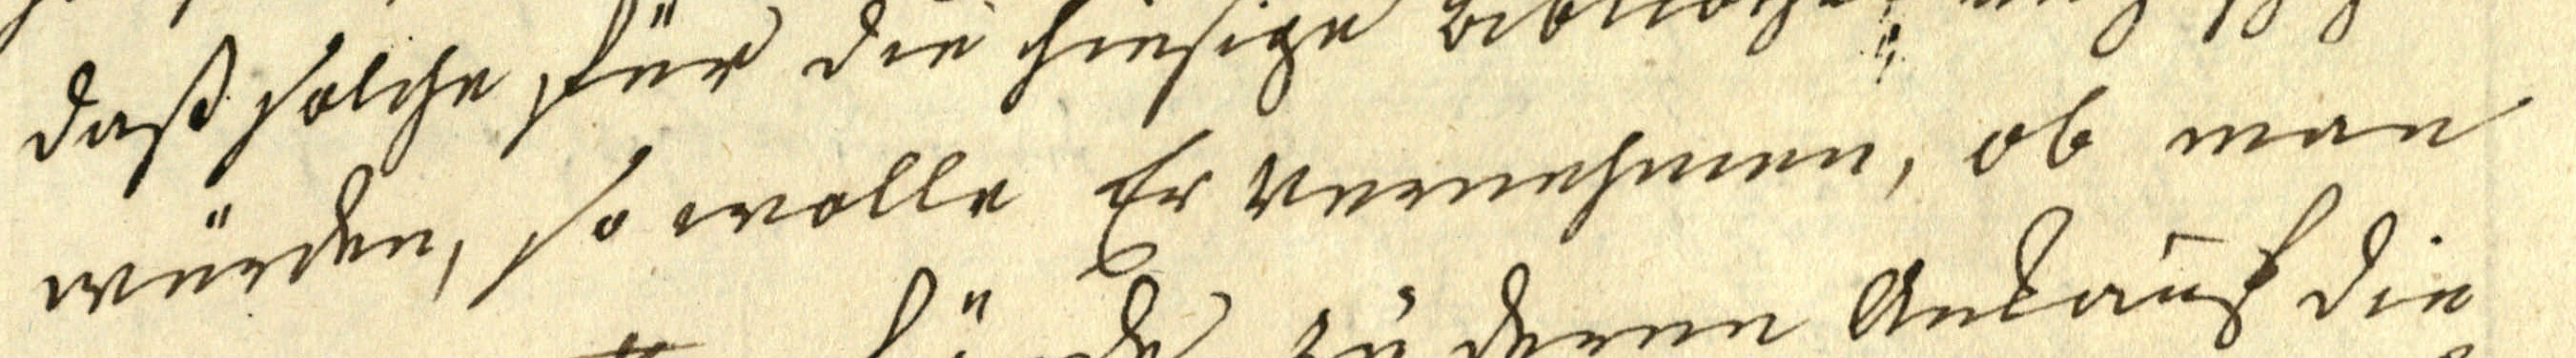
würden, so wolle Er vernehmen, ob man
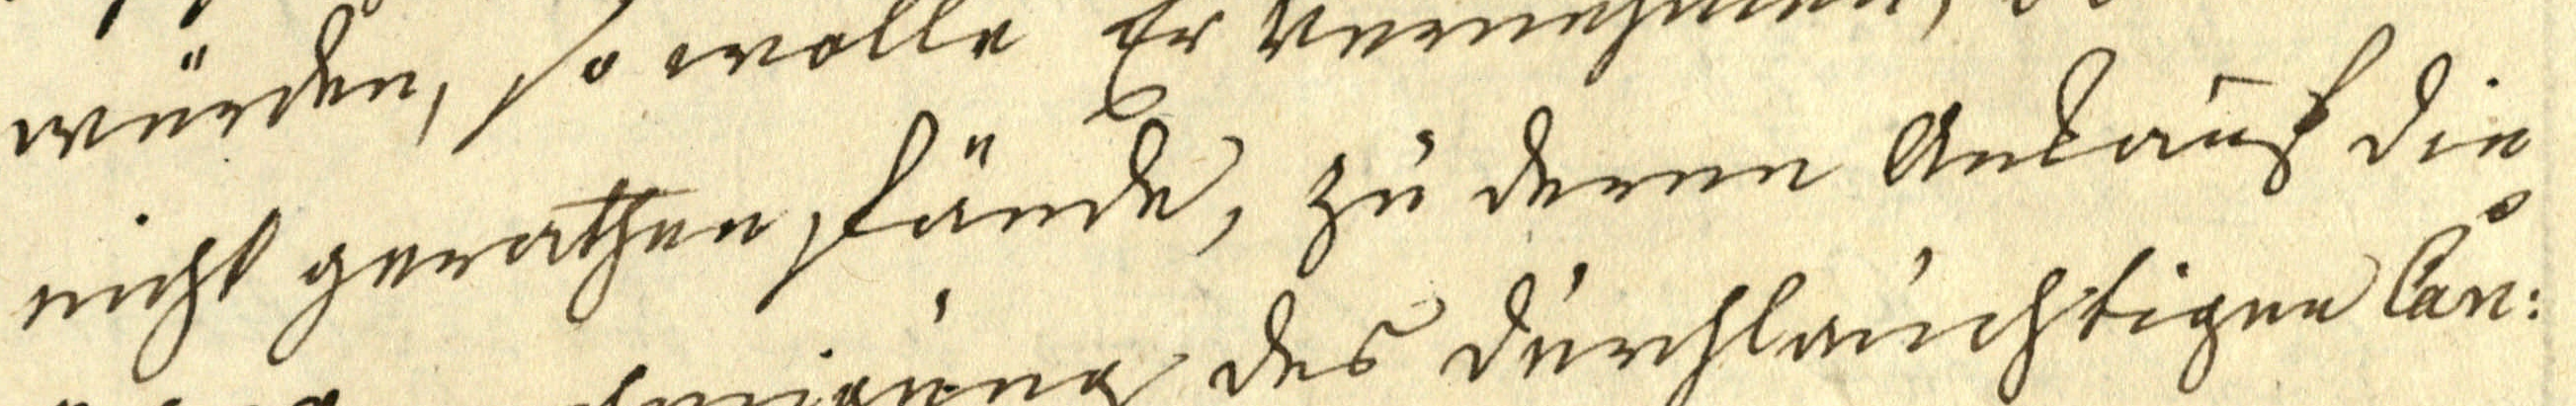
nicht gerathen fände, zu deren Ankauf die
